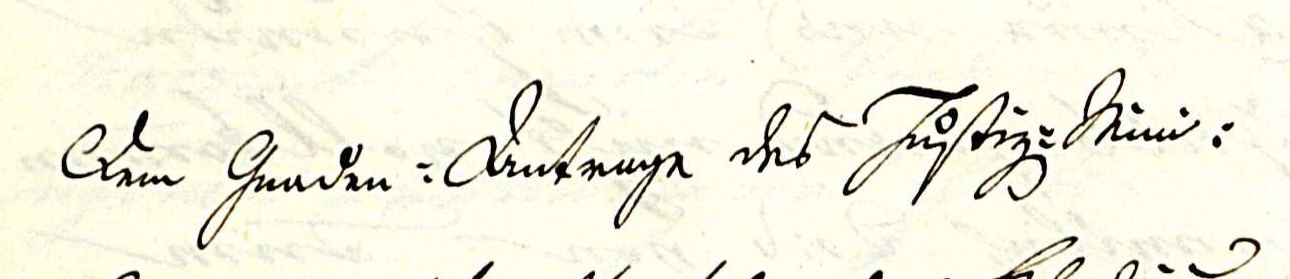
Dem Gnaden-Antrage des Justiz-Mini¬
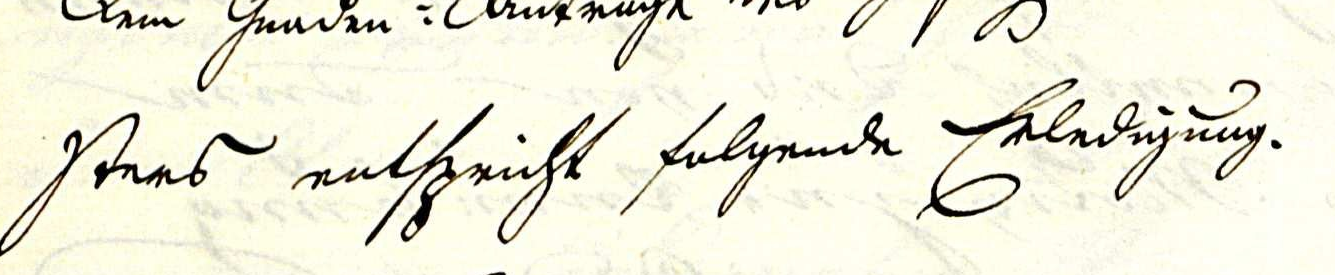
sters entspricht folgende Erledigung.
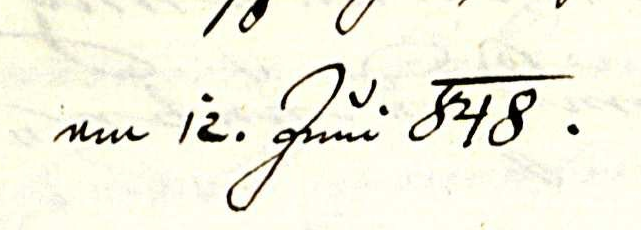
Am 12. Juni [1]848
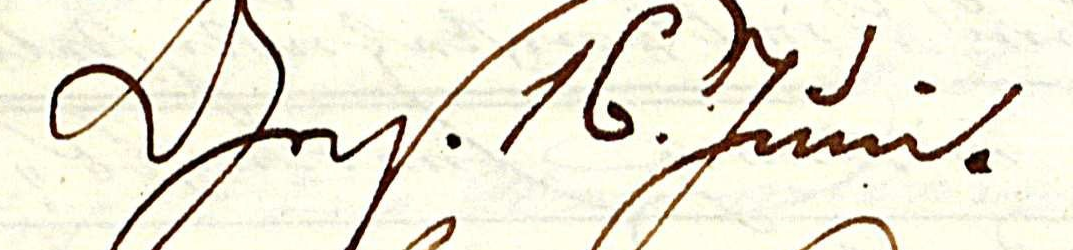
Ges. 16 Juni
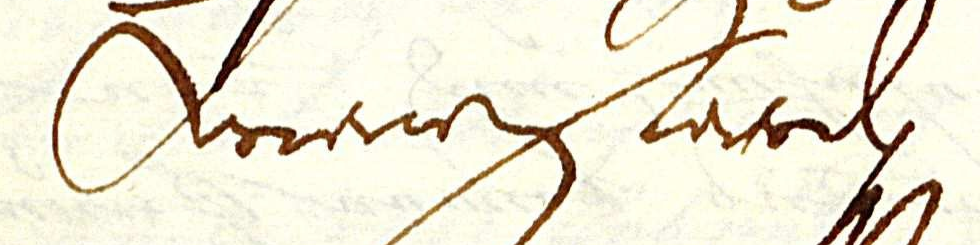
Frank Karl
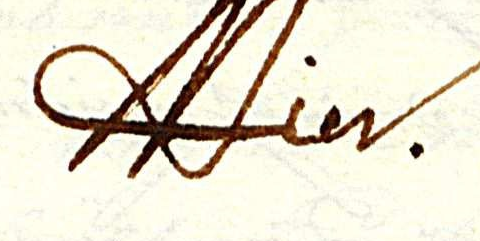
Min.
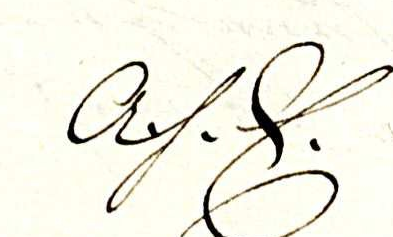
AhE
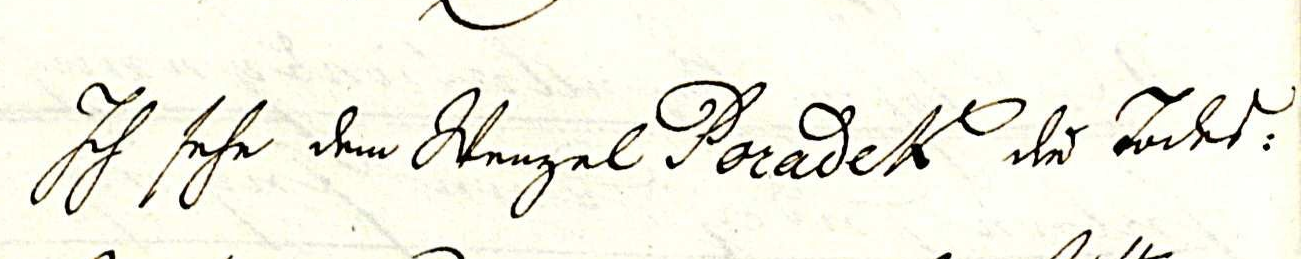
Ich sehe dem Wenzel Poradek die Todes¬
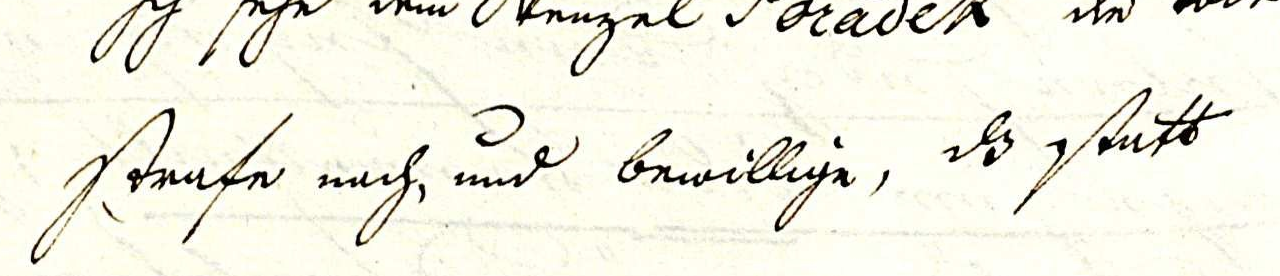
strafe nach und bewillige, das statt
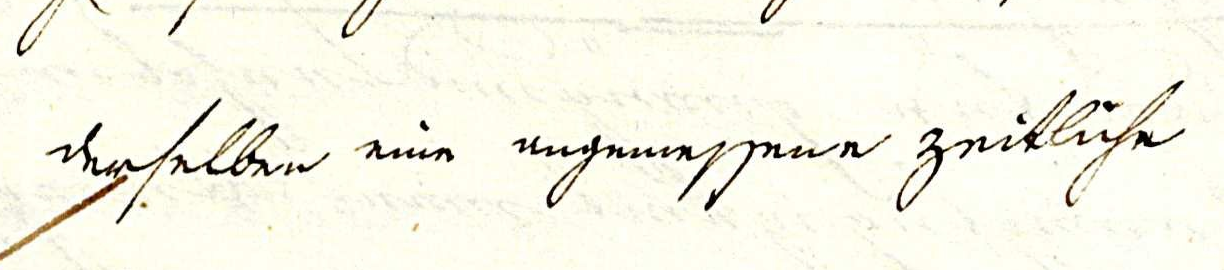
derselben eine angemessene zeitliche
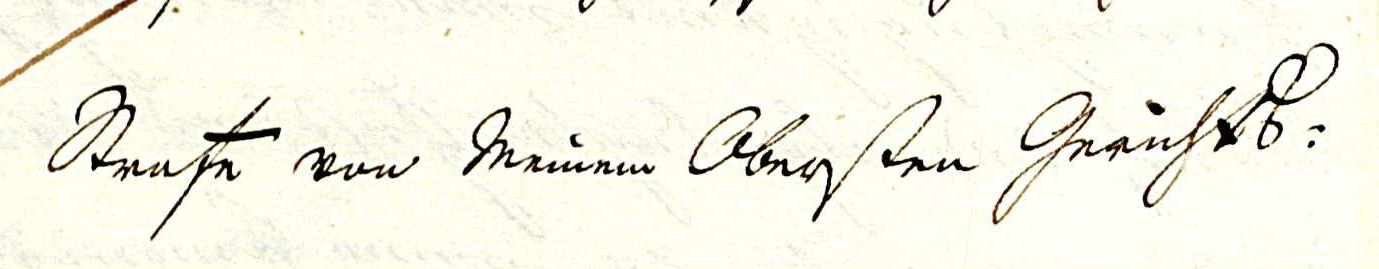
Strafe von Meinem Obersten Gerichts¬
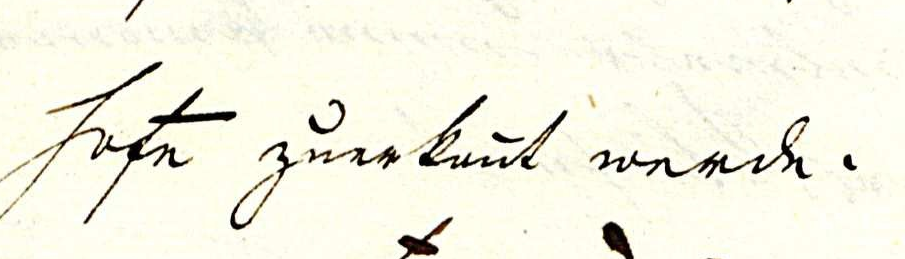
hofe zuerkannt werde.
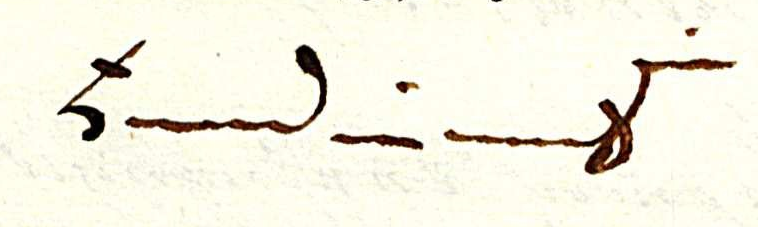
Ferdinand
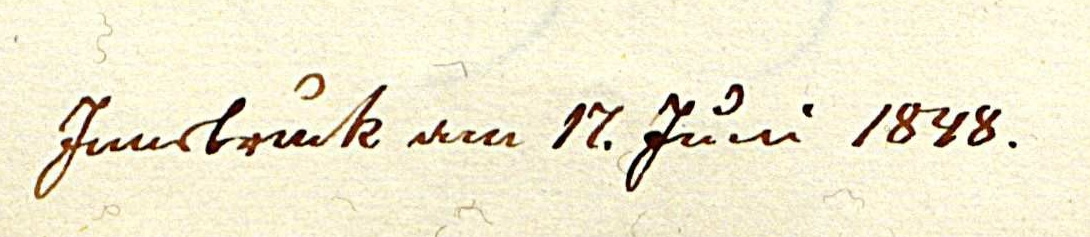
Innsbruck am 17. Juni 1848
